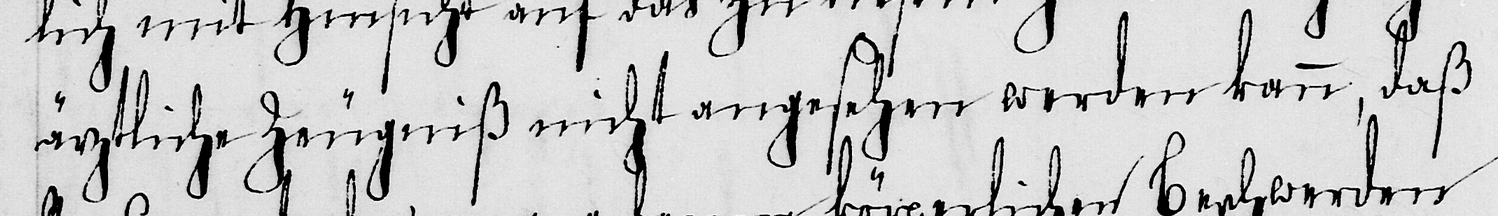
ärztliche Zeugniß nicht angesehen werden kann, daß
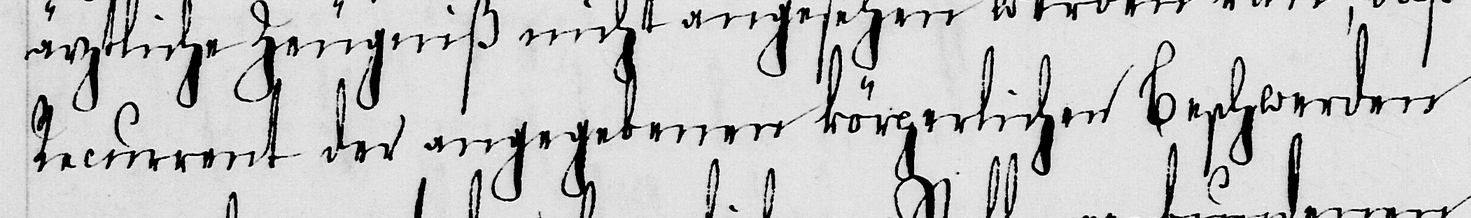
Recurrent der angegebenen körperlichen Beschwerden
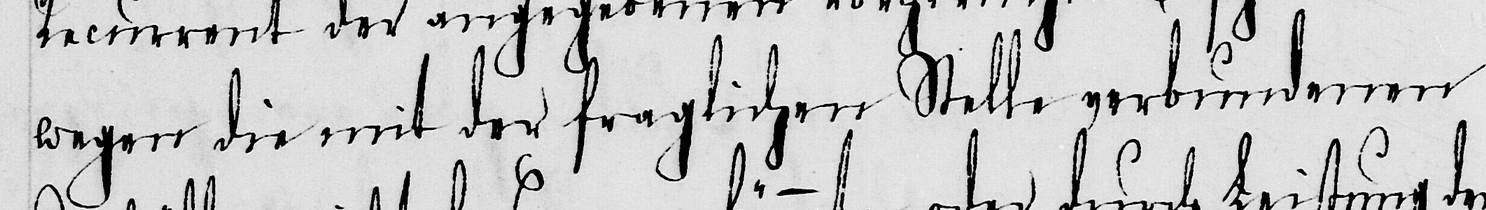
wegen die mit der fraglichen Stelle verbundenen
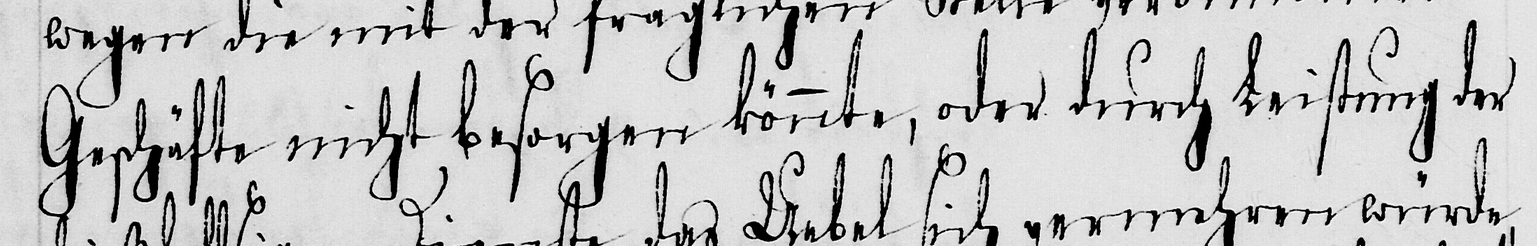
Geschäfte nicht besorgen könnte, oder durch Leistung der
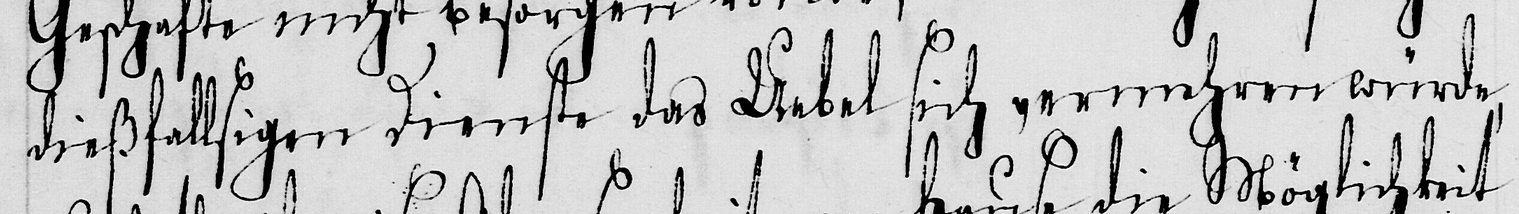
dießfallsigen Dienste das Uebel sich vermehren würde,
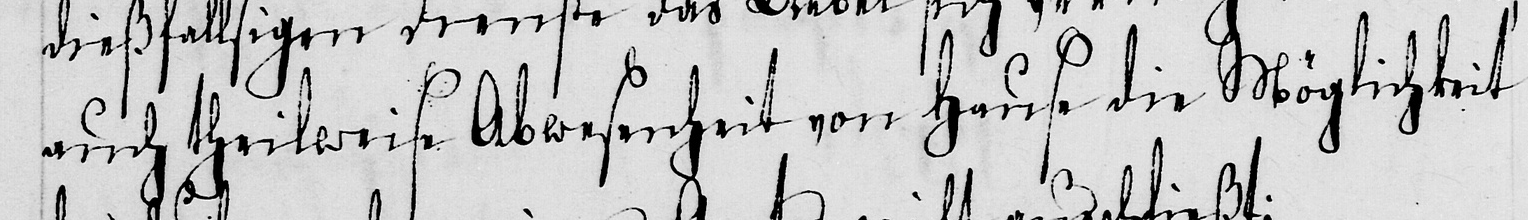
auch theilweise Abwesenheit von Hause die Möglichkeit
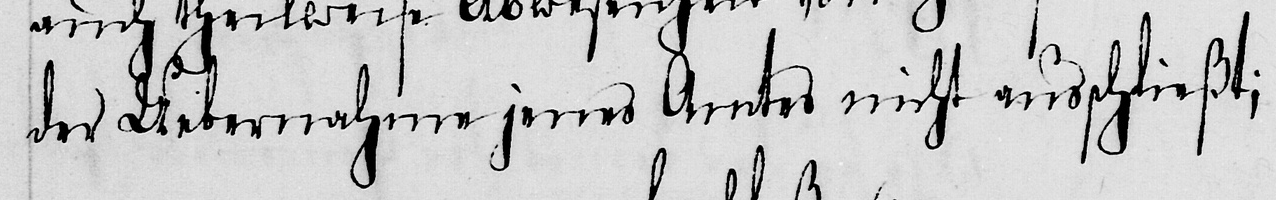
der Uebernahme jenes Amtes nicht ausschließt;
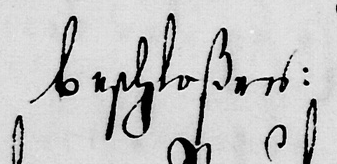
beschloßen:
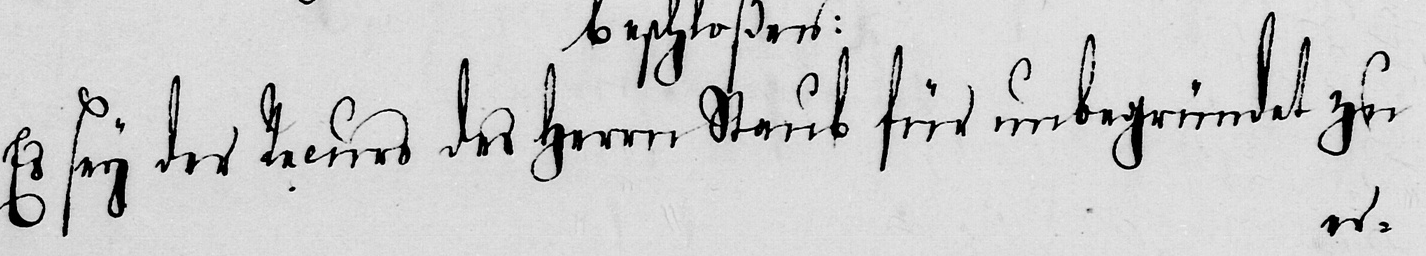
sey der Recurs des Herrn Staub für unbegründet zu
